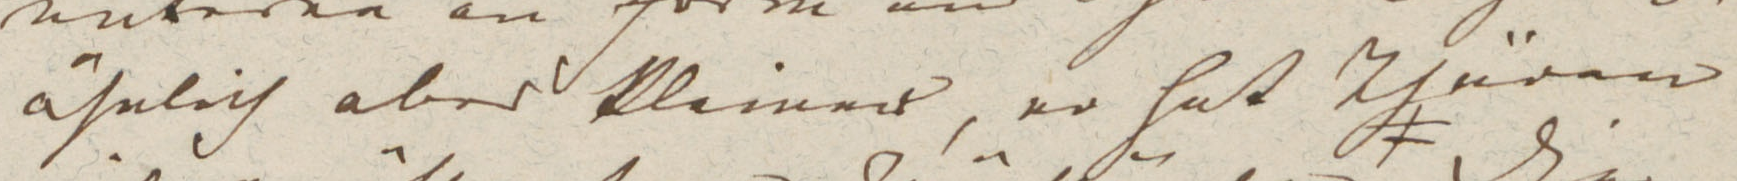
ähnlich aber kleiner, er hat Thüren
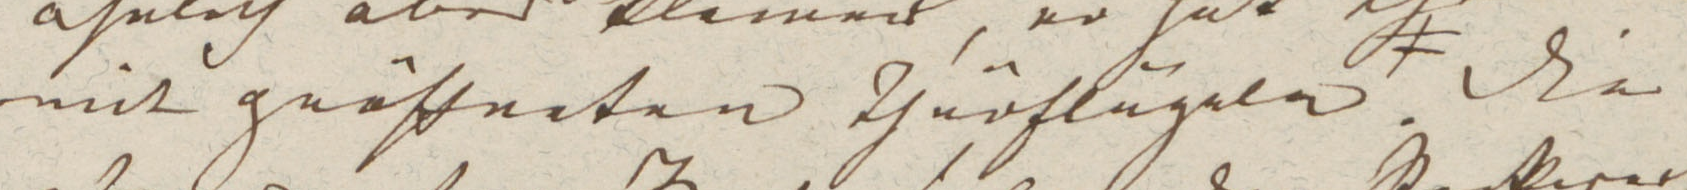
mit geöffneten Thürflügeln %. Die
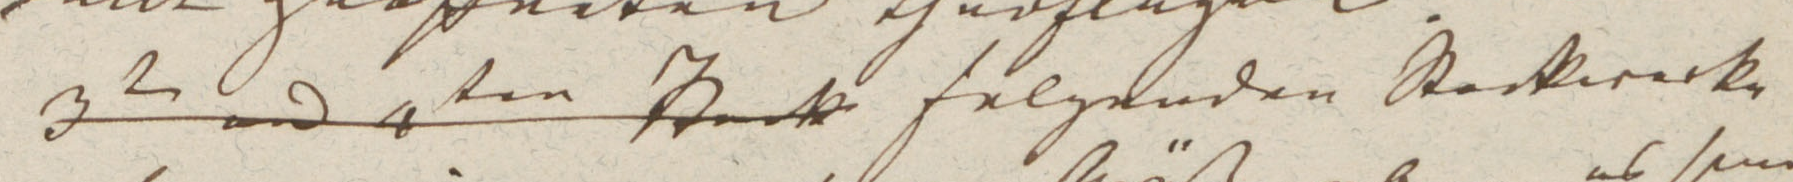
3te und 4ten tock folgenden Stockwerke
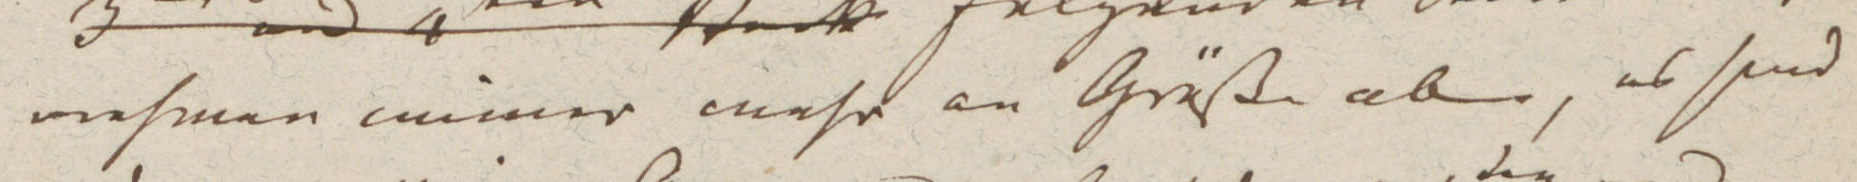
nehmen immer mehr an Grösse ab, es sind
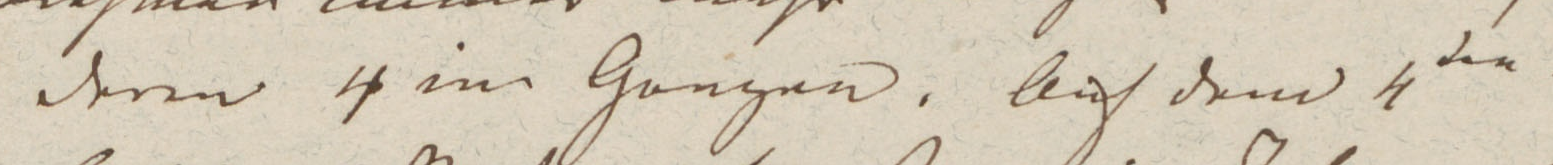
deren 4 im Ganzen. Auf dem 4ten
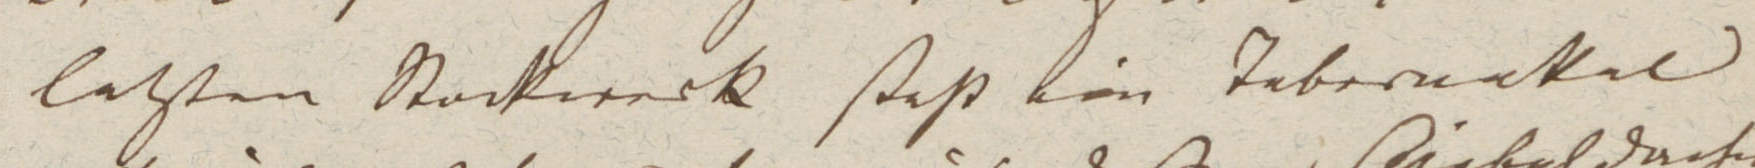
letzten Stockwerk steht ein Tabernakel
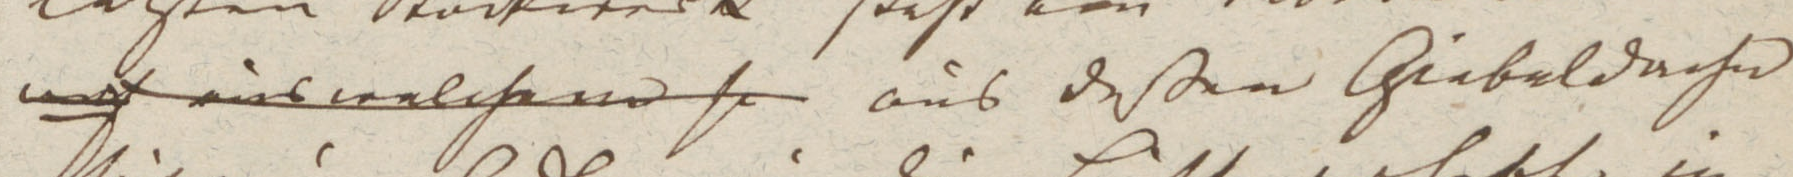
f aus welchem si aus dessen Giebeldache
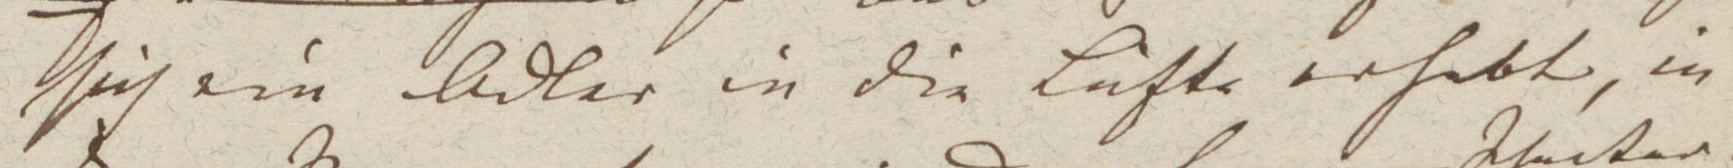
sich ein Adler in die Lüfte erhebt, in
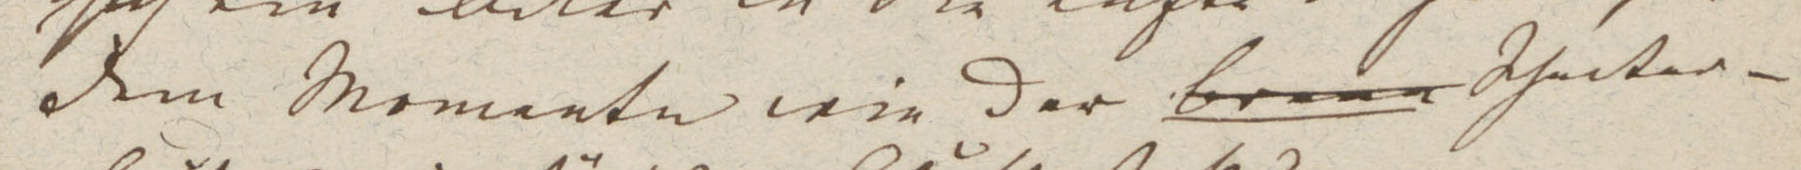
dem Momente wie der brenn Scheiter-
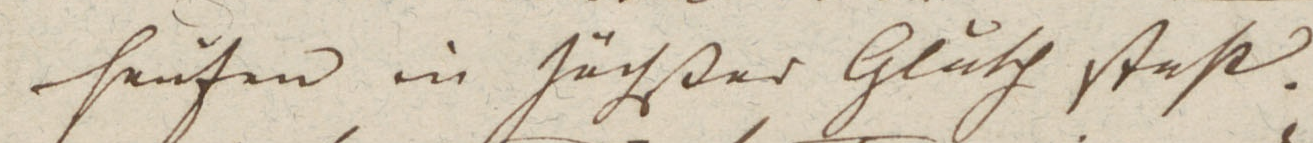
haufen in höchster Gluth steht.
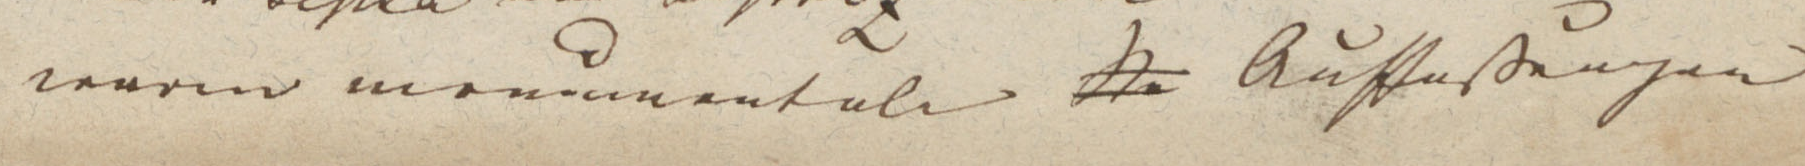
waren monumentale Auffassungen
